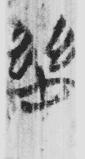𪪋
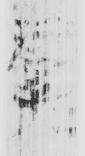君子=
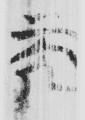而
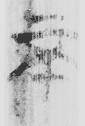不
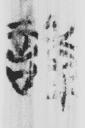{言屮目牛}
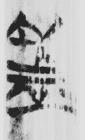箸
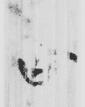占
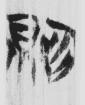則
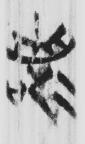若
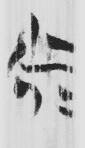小人=
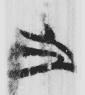之
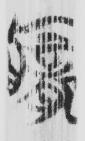{疒龍}
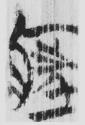{疒㞷}
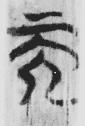而
